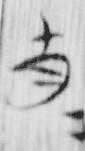十月
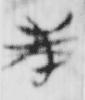未
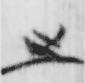之
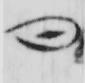日
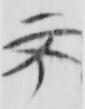不
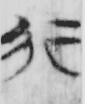行
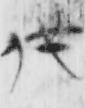代
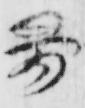昜（陽）
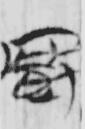○（厩）
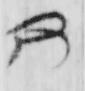尹
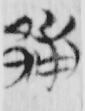郙
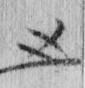之
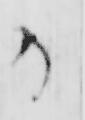人
